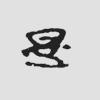是
